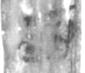西
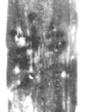東
